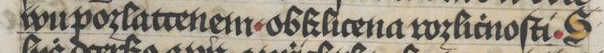wu pozlatcenem.obklicena rozliċnoſtí.S¬
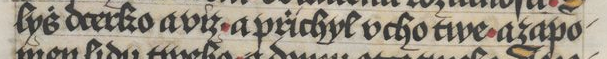lyš dcerko a viz.a pṙíchyl vcho twe.a zapo¬
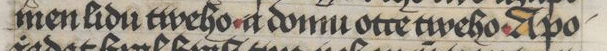men lidu tweho.a domu otce tweho.A po¬
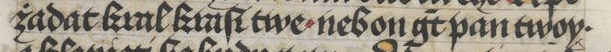żadat kral kraſi twe.neb on ḡt pan twoy.
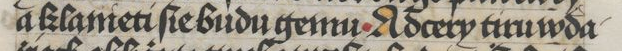a klanieti ſie budu gemu.A dcery tíru wda¬
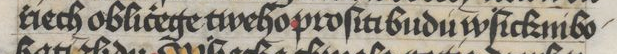ṙíech obliċege tweho.proſiti budú wẛickni bo¬
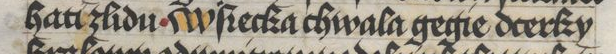hati zlidu.Wẛiecka chwala gegíe dcerky
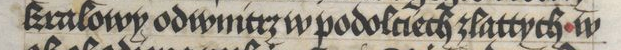kralowy odwnítrz w podolcíech zlattych.w¬
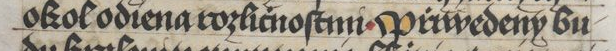okol odíena rozliċnoſtmi.Pṙiwedeny bu¬
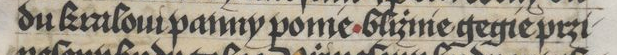du kraloui panny poníe.bliżníe gegíe przí¬
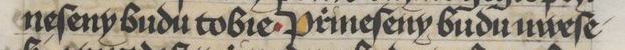neſeny budu tobie.Pṙineſeny budu uweſe¬
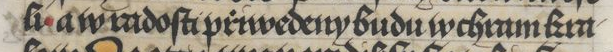lí.a w radoſti pṙiwedeny budu w chram kra¬
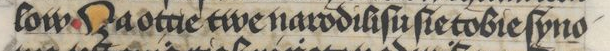low.Za otcie twe narodiliſu ſie tobie ſyno¬
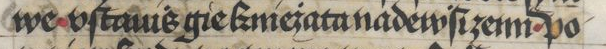we.vſtauíš gie kníeżata nadewẛi zemi.Po¬
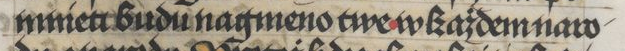mníeti budu nagmeno twe.w każdem naro¬
